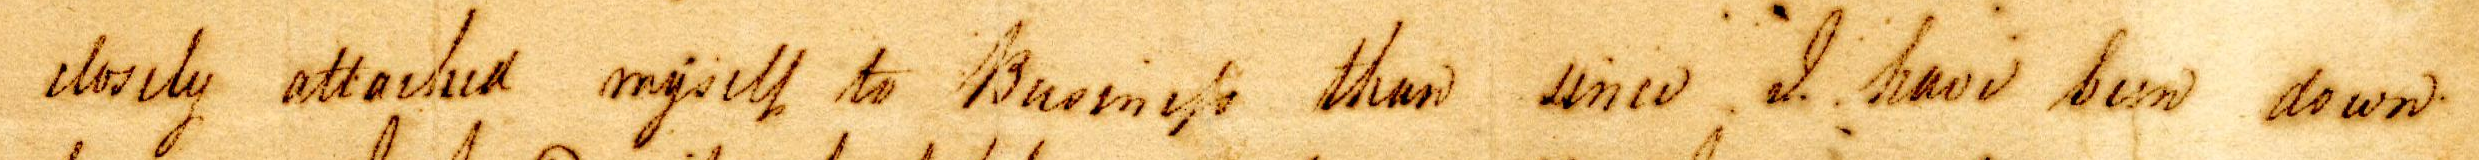closely attached myself to Business than since I have been down
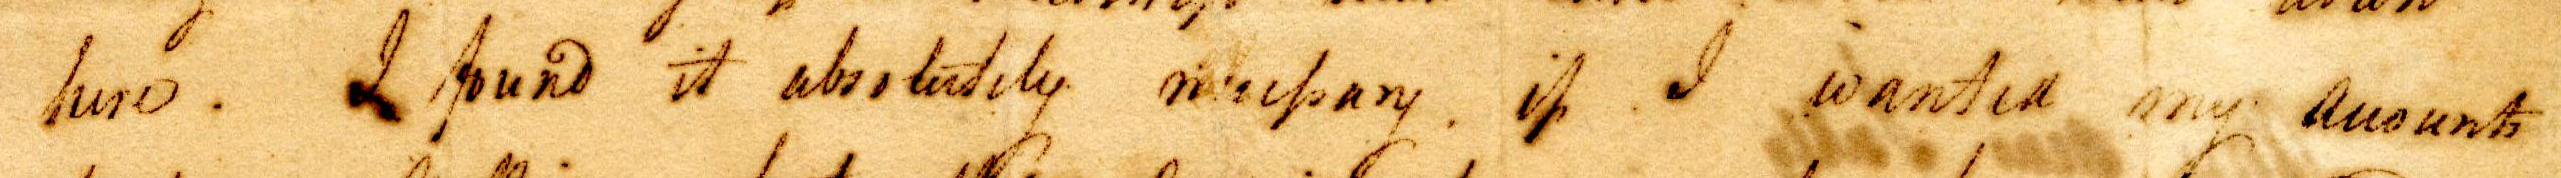here. I found it absolutely necessary if I wanted my accounts
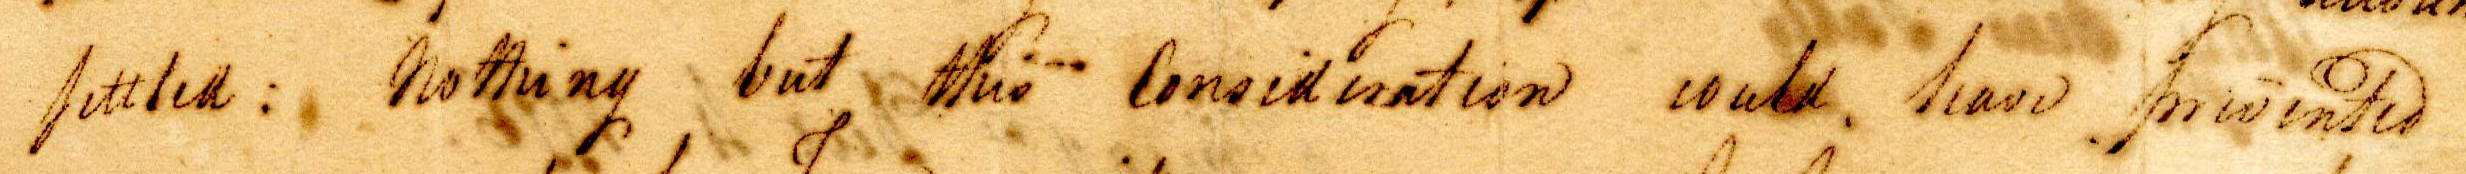settled: Nothing but this Consideration could have prevented
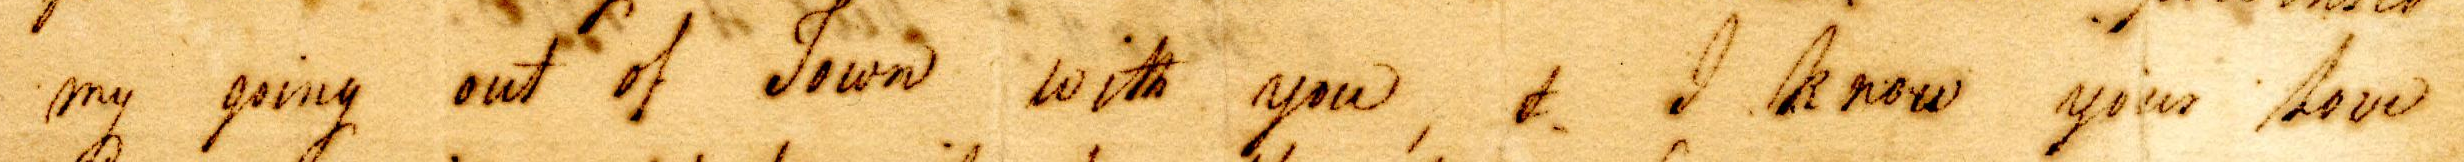my going out of Town with you, & I know your Love
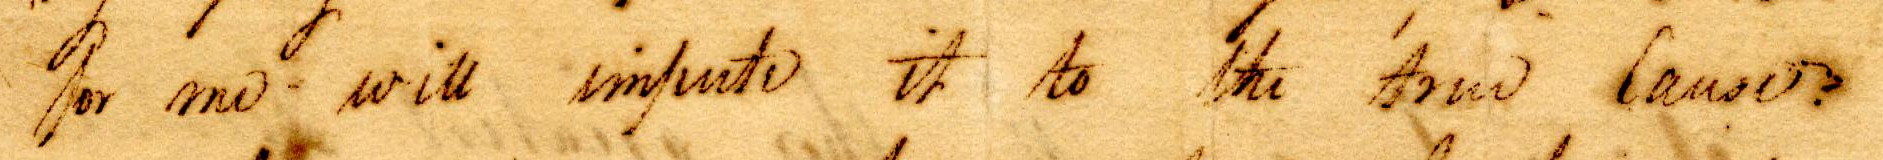for me will impute it to the true Cause.
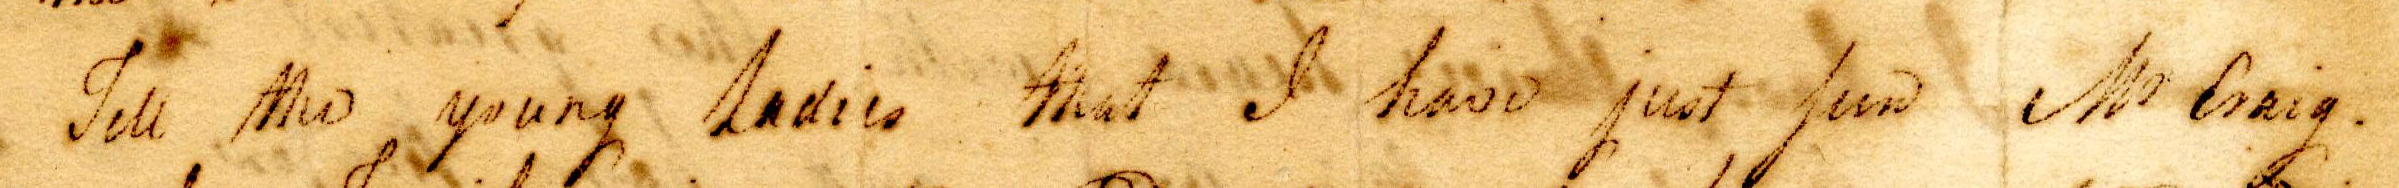Tell the young Ladies that I have just seen M^r Craig.
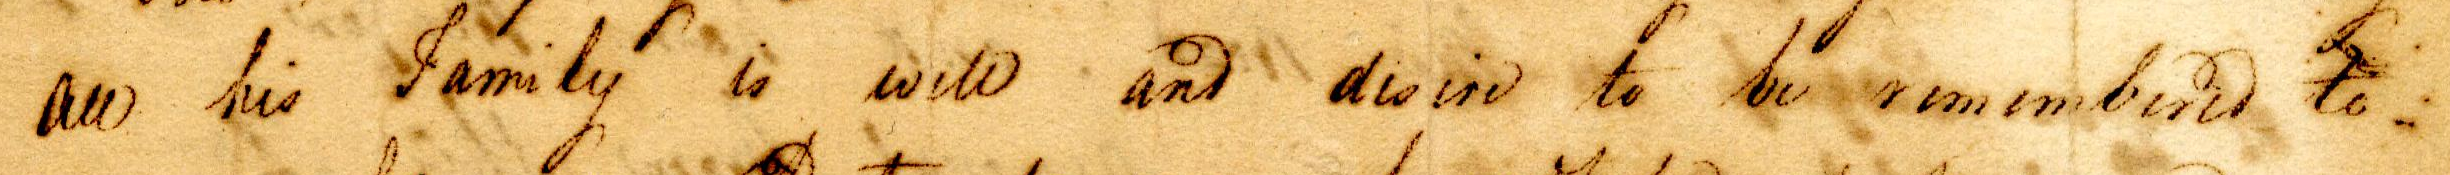All his Family is well and desire to be remembered to
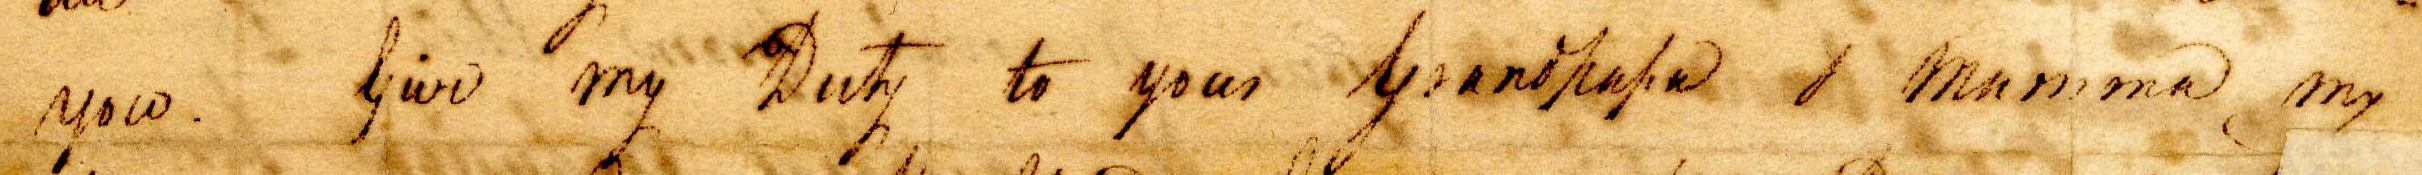you. Give my Duty to your Grandpapa & Mamma my
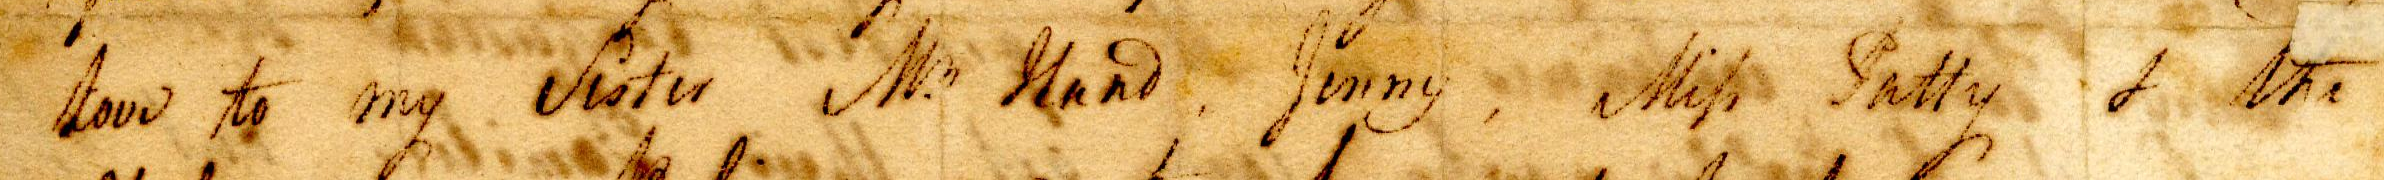love to my Sister M^r. Hand, Jenny, Miss Patty & the
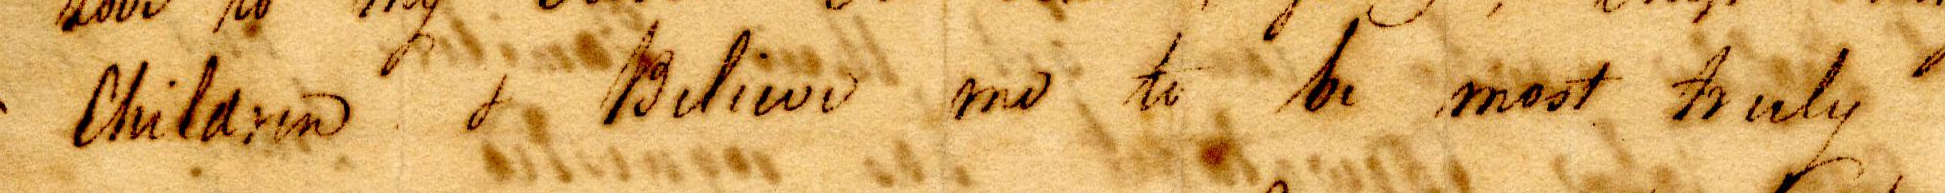Children & Believe me to be most truly
